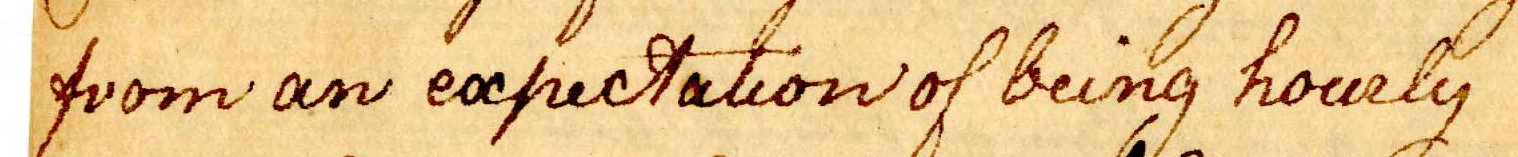from an expectation of being hourly
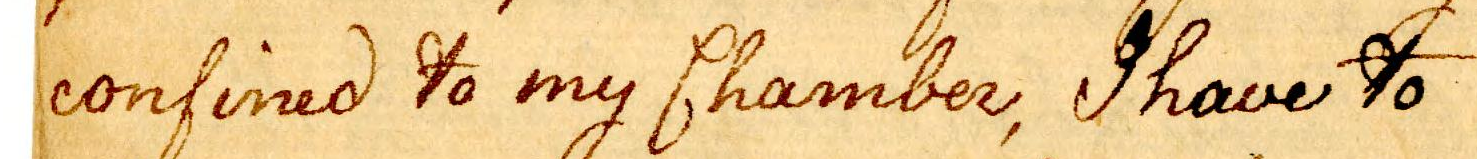confined to my Chamber, I have to
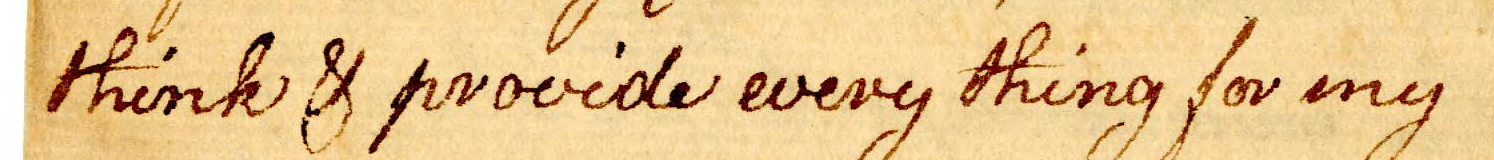think & provide every thing for my
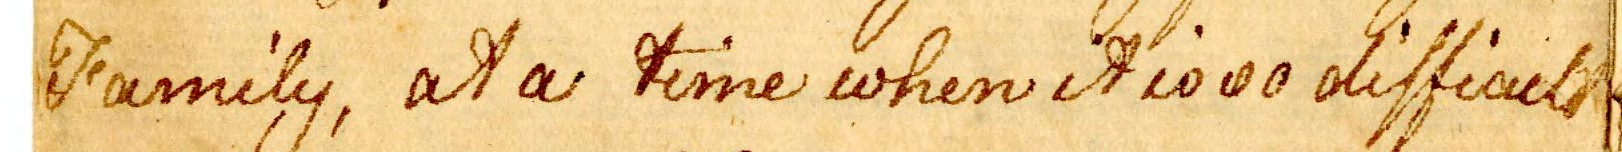Family, at a time when itis so difficul
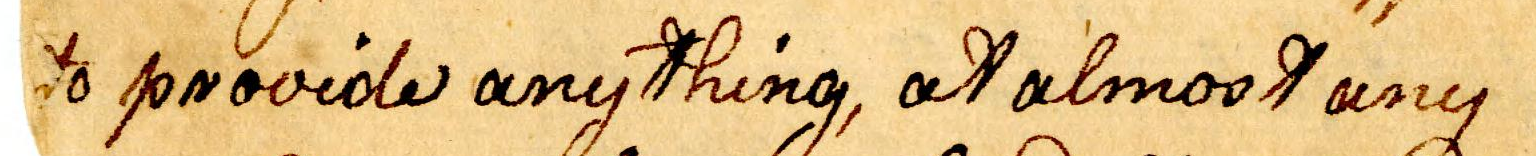to provide anything, at almost any
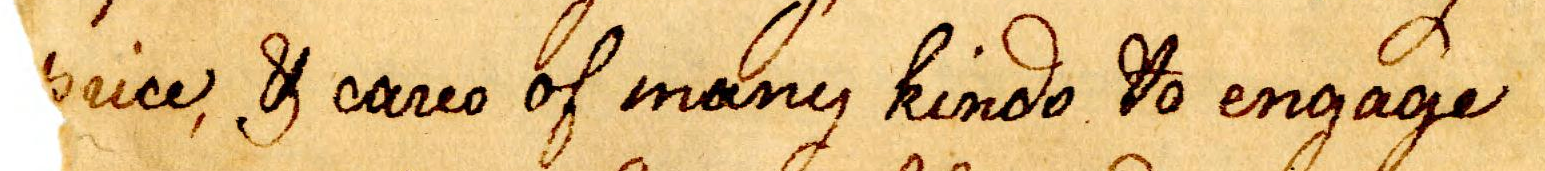price, & cares of many kinds to engage
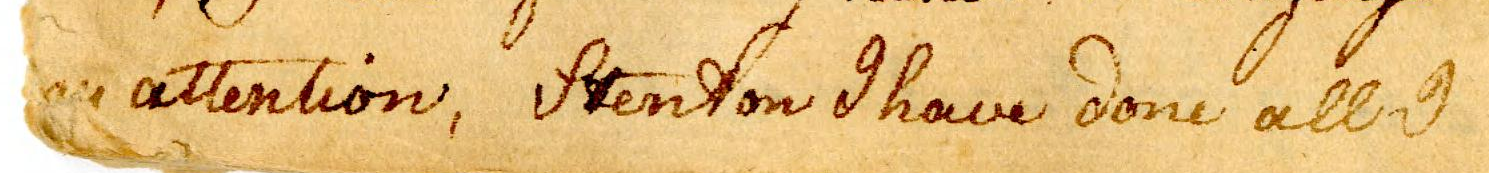[__] attention, Stenton I have done all I
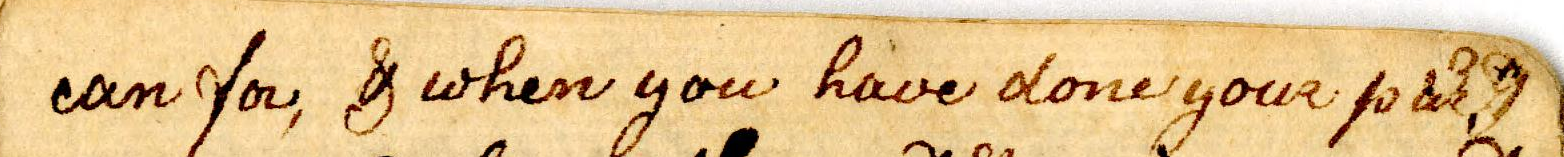can for, & when you have done your part 39
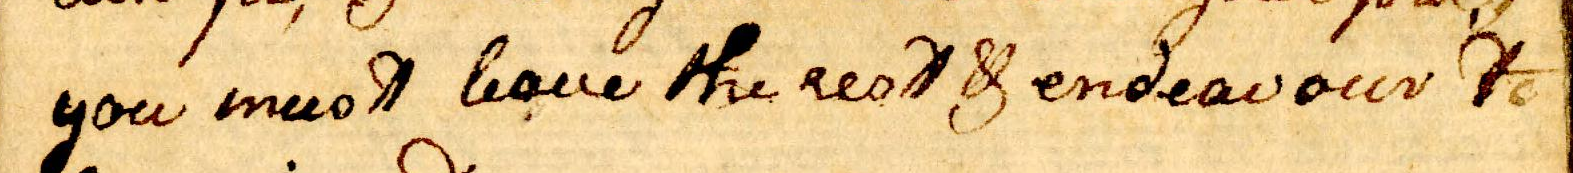you must leave the rest & endeavour to
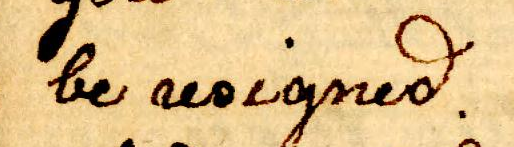be resigned.
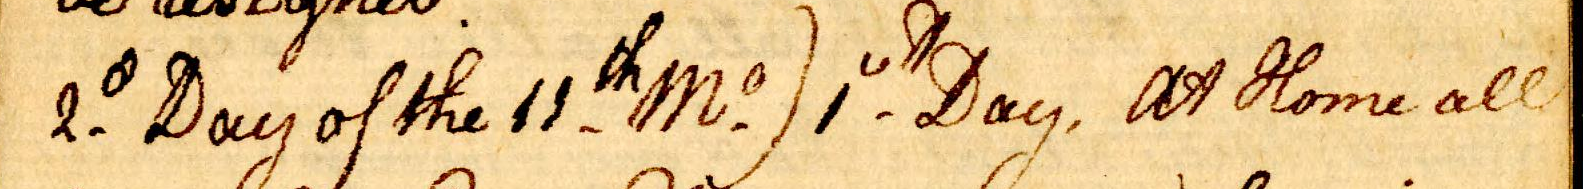2^d Day of the 11^th M^o) 1^st Day, At Home all
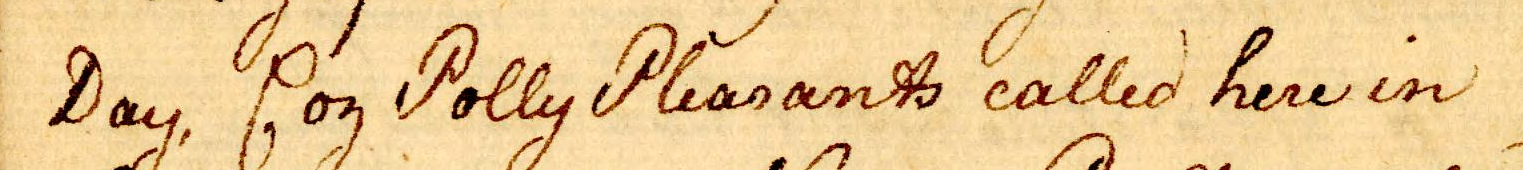Day, Coz Polly Pleasants called here in
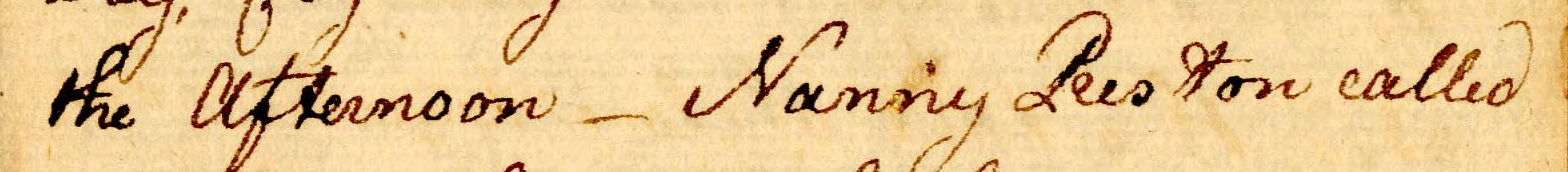the Afternoon, Nanny Preston called
